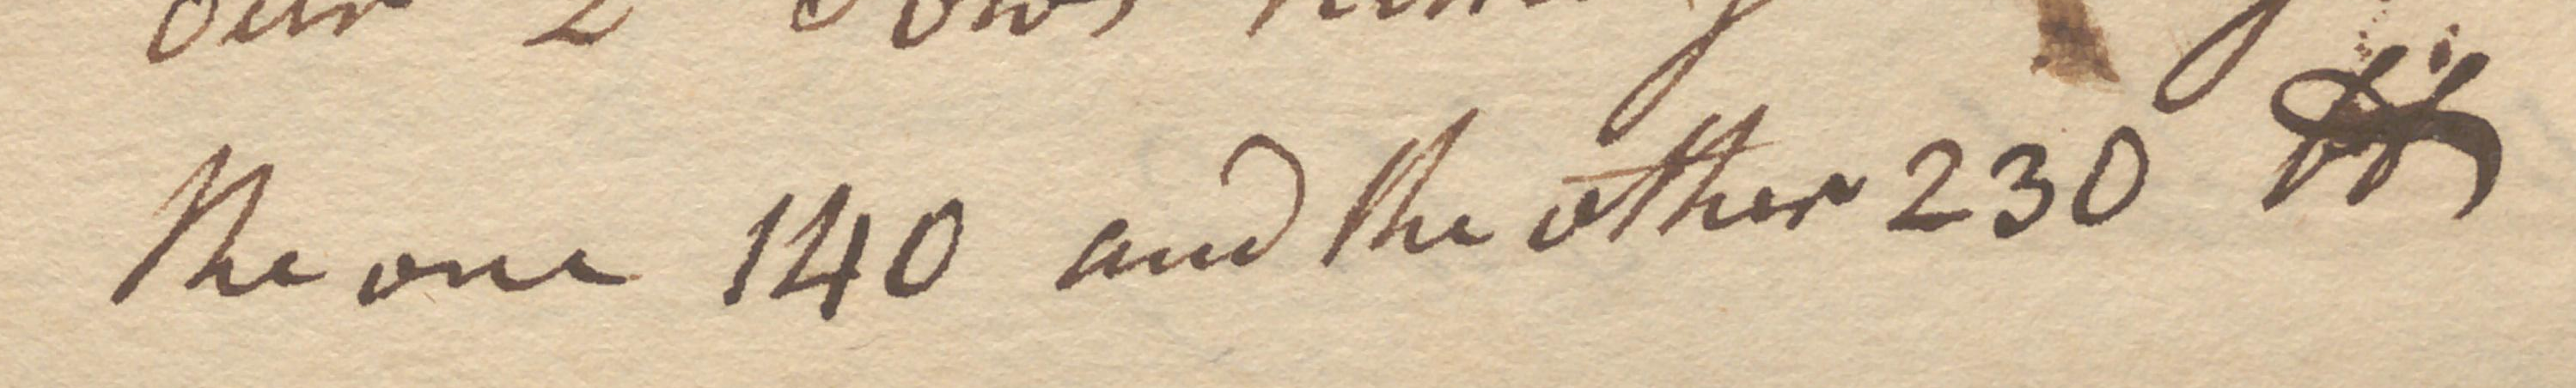the one 140 and the other 230 lb
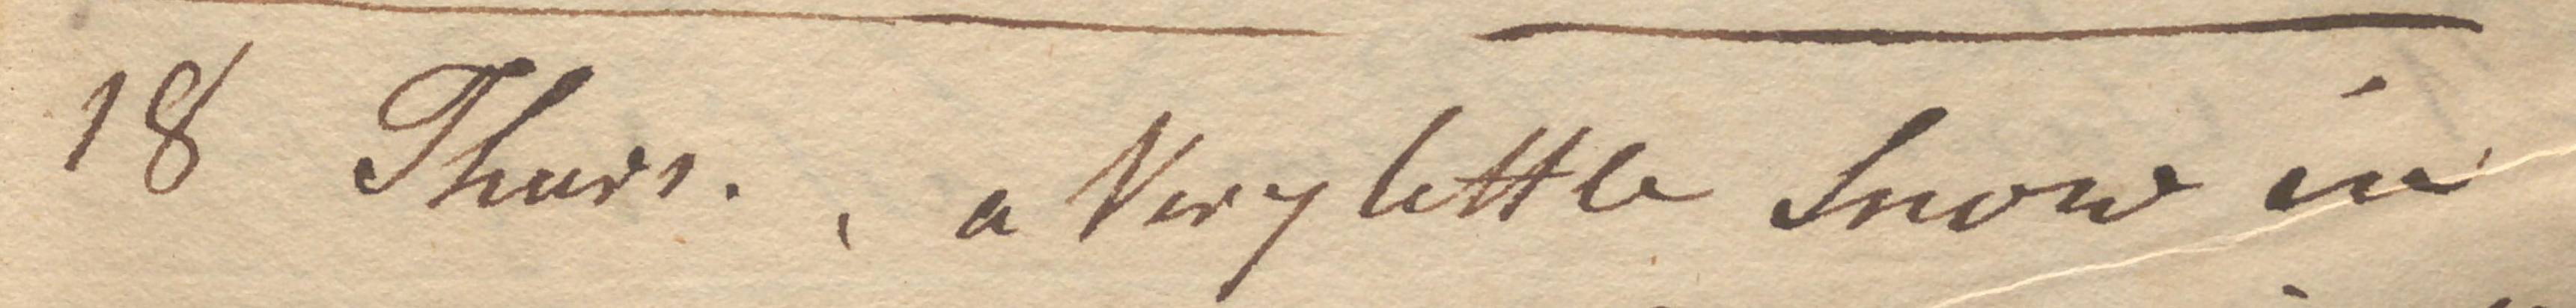8 Thurs. a Very little Snow in
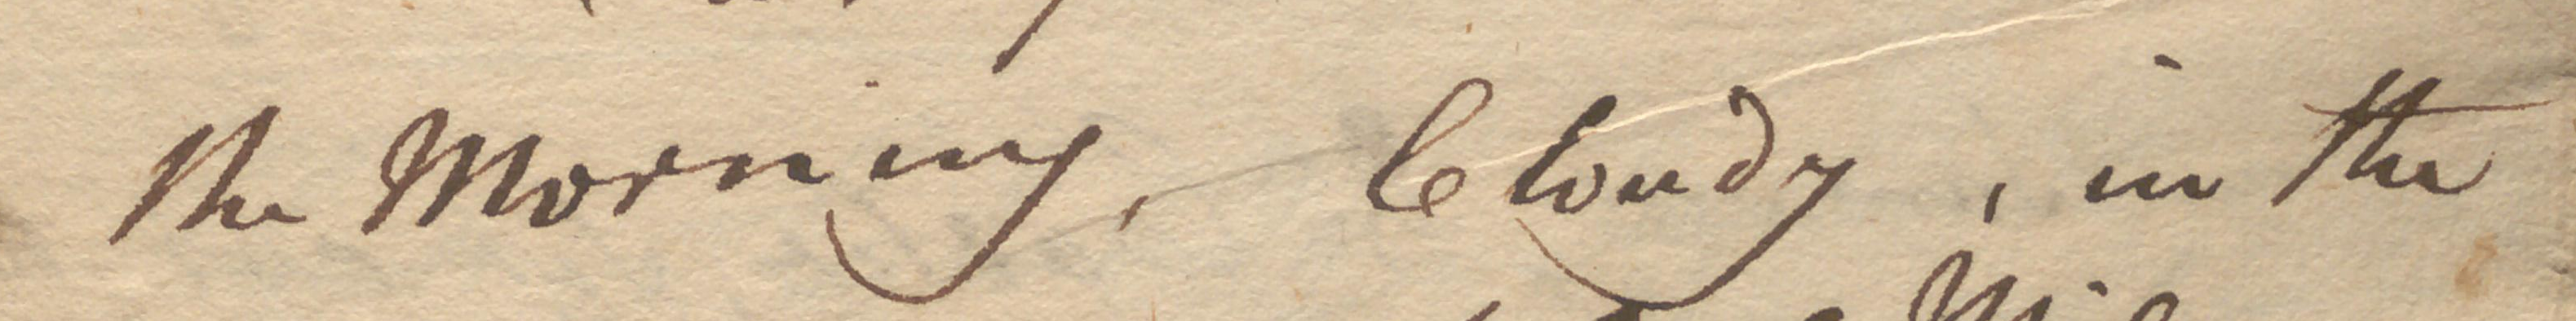the Morning, Cloudy, in the
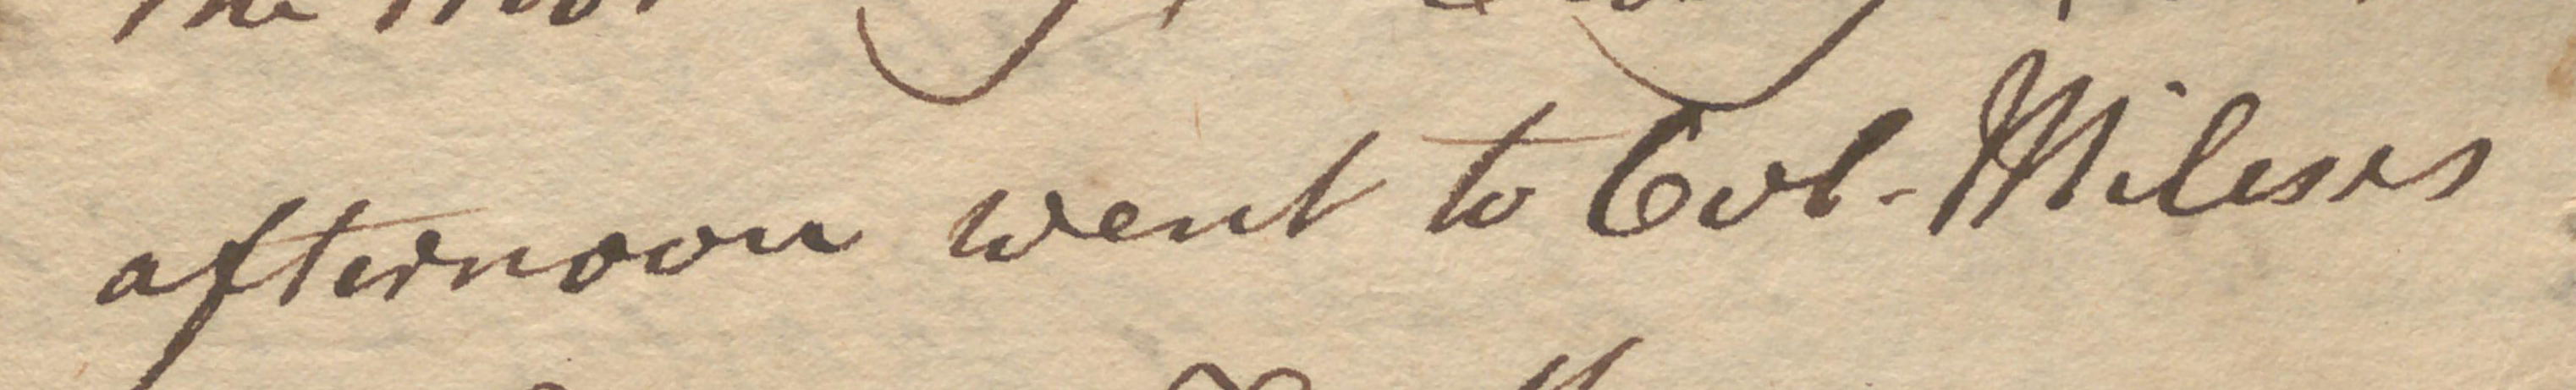afternoon went to Col. Mileses
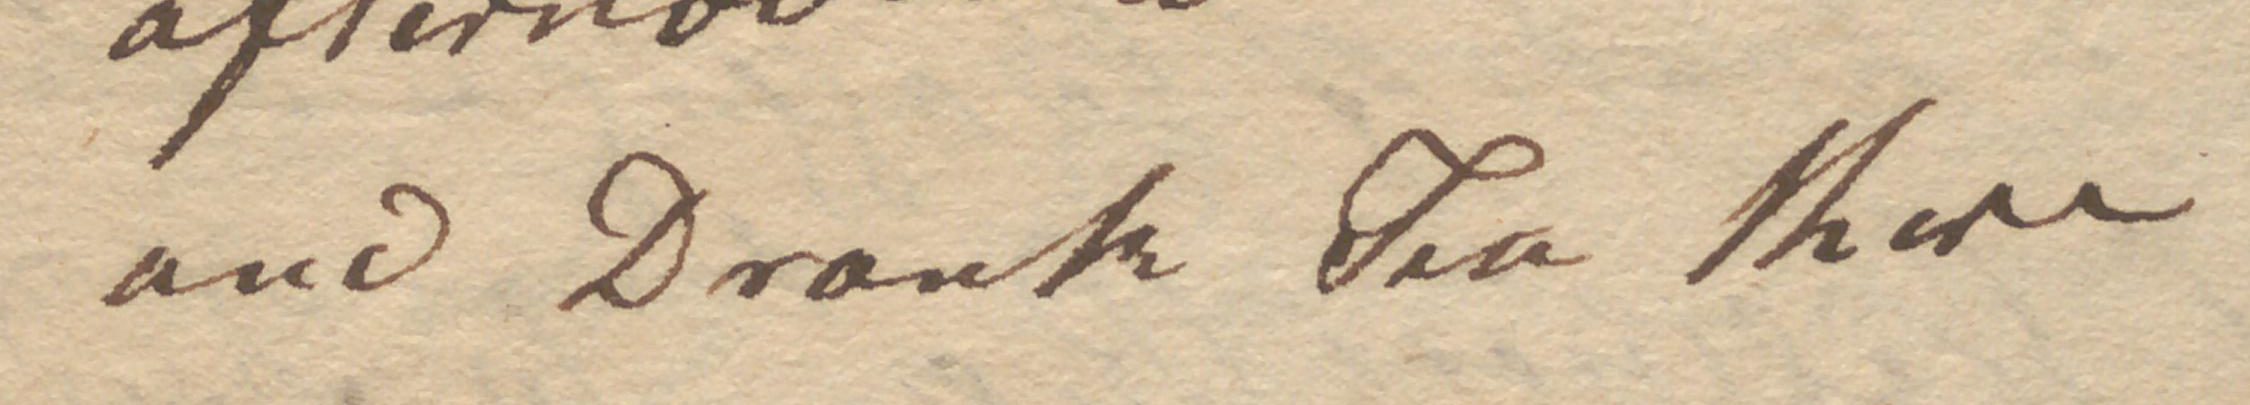and Drank Tea there
